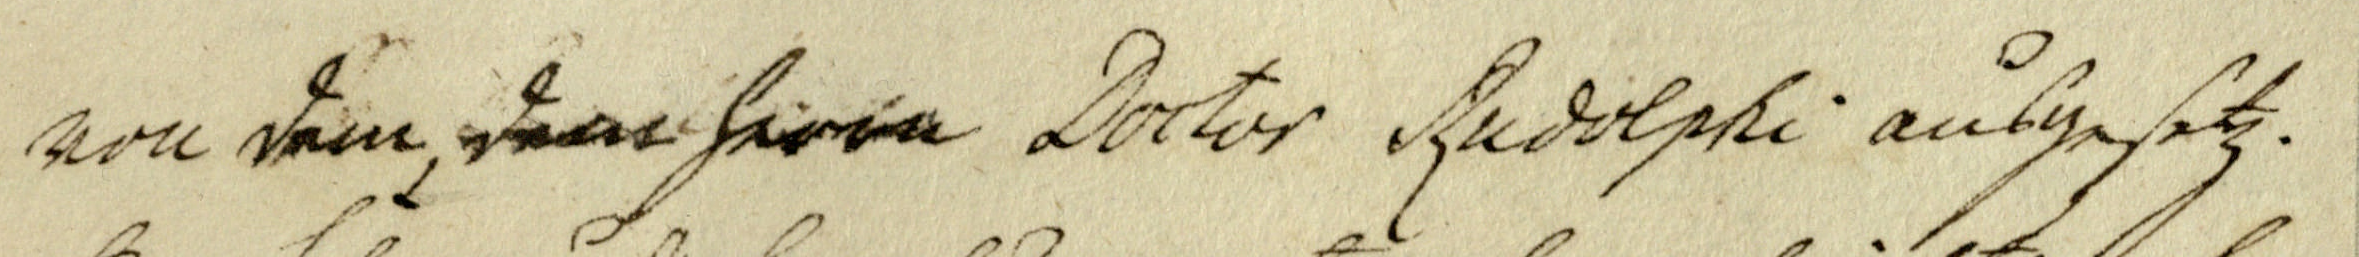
von dem, dem Herrn Doctor Rudolphi ausgesetz¬
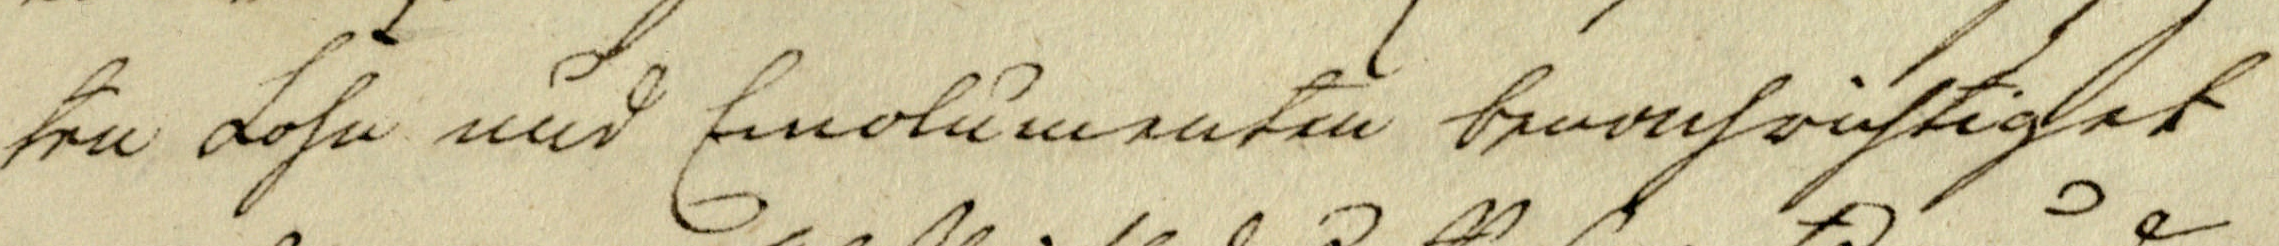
ten Lohn und Emolumenten benachrichtiget
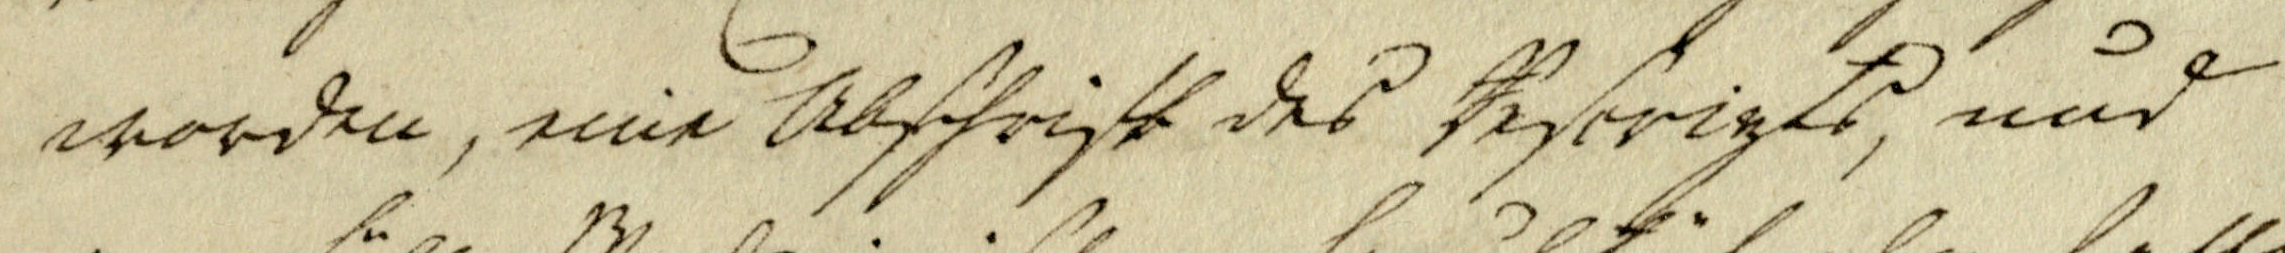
worden, eine Abschrift des Rescripts, und
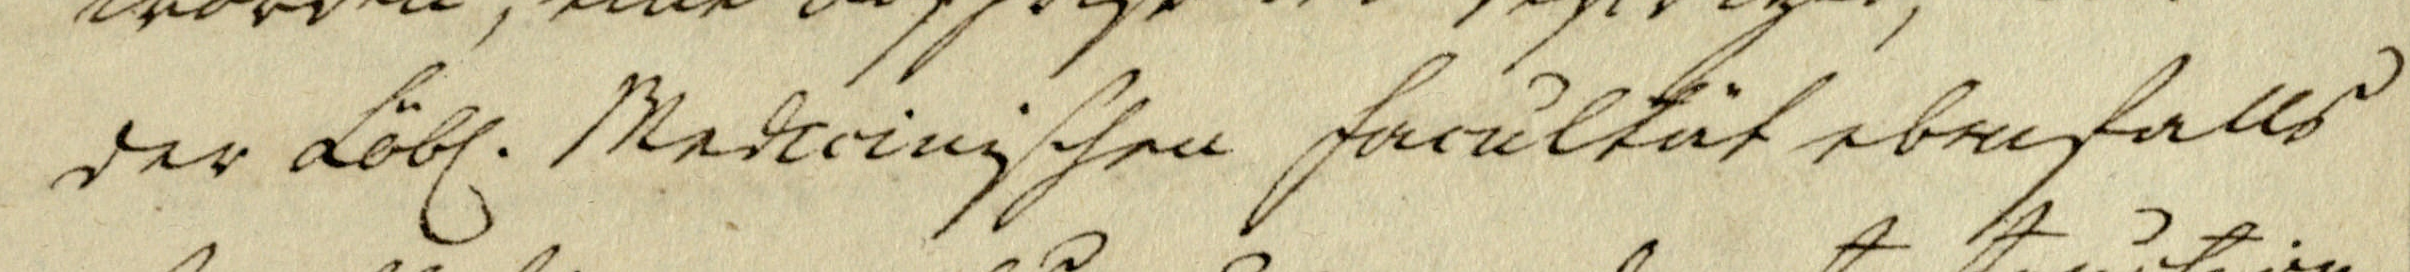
der Löbl. Medicinischen Facultät ebenfalls
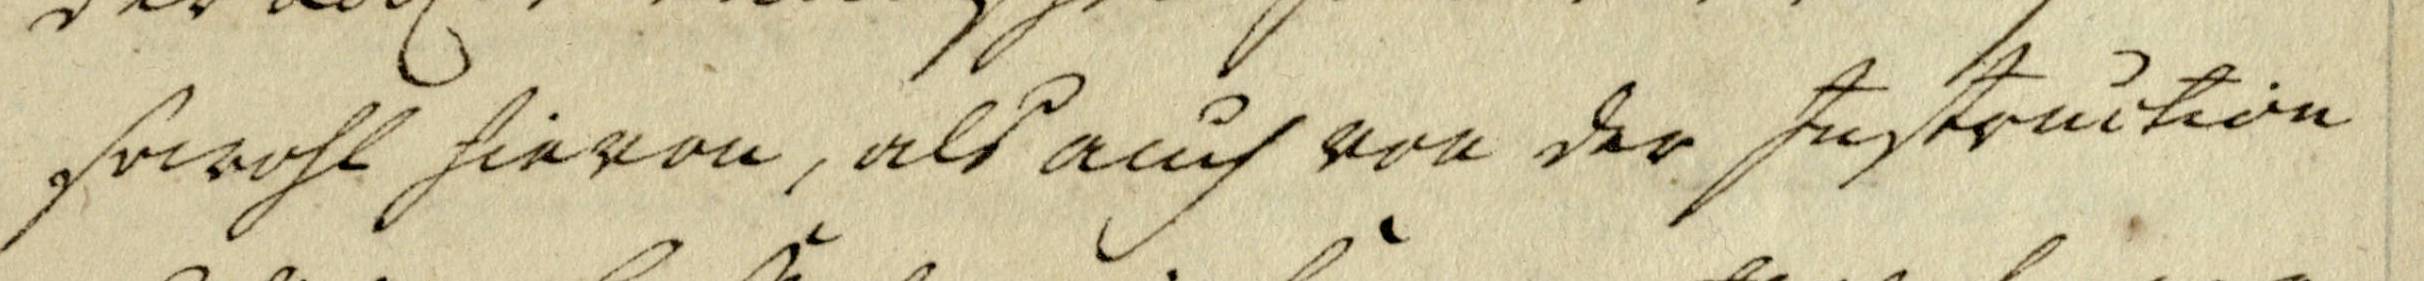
sowohl hievon, als auch von der Instruction
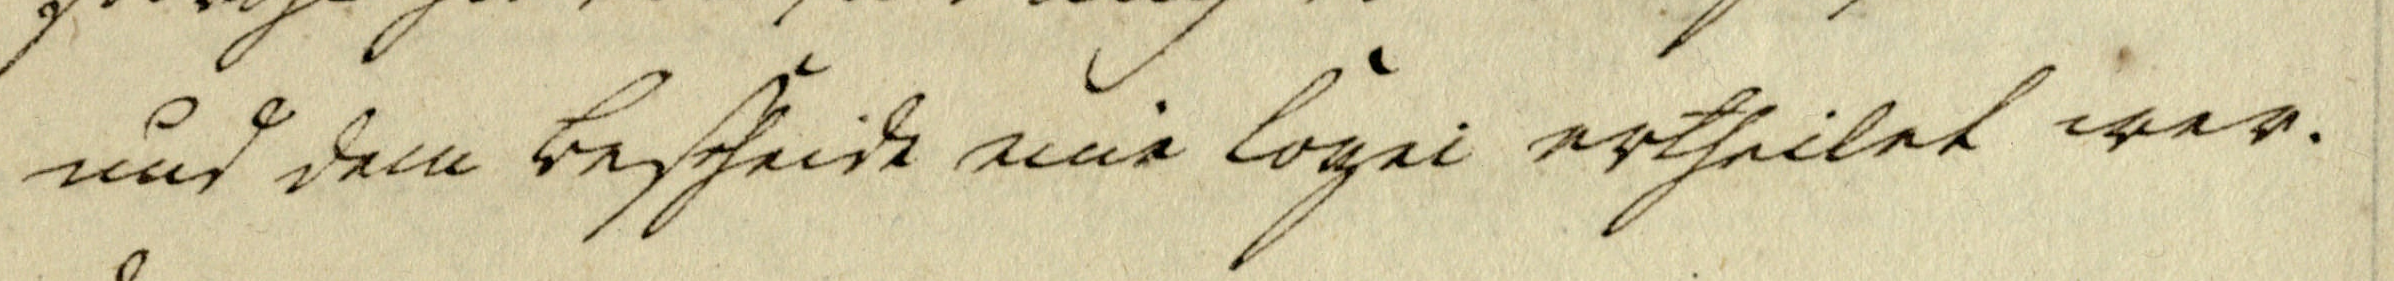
und dem Bescheide eine Copei ertheilet wer¬
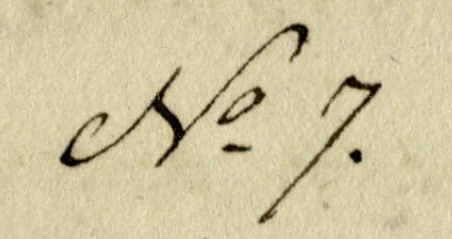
No 7.
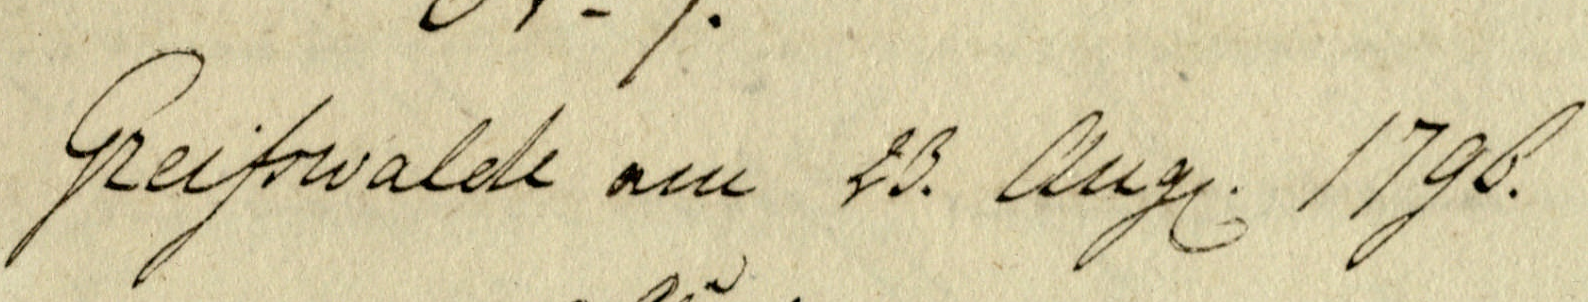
Greifswalde in 23. Aug. 1796.
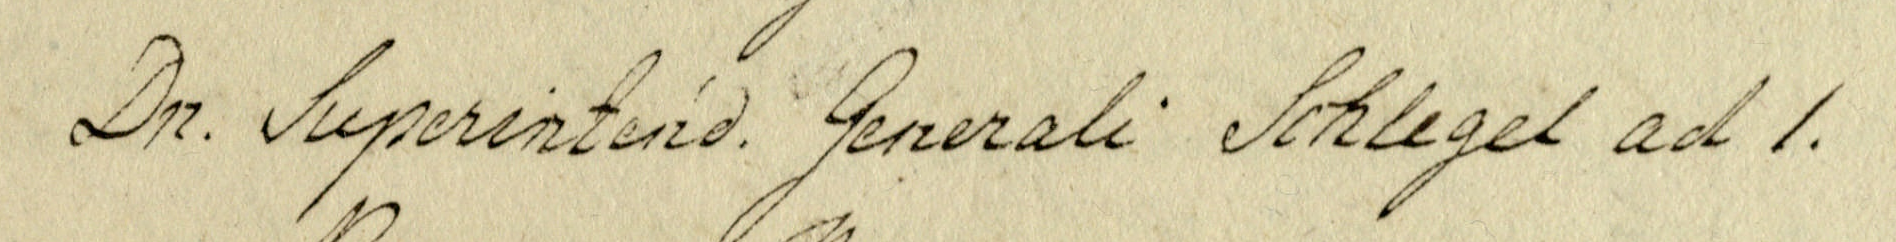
Dn. Superintend. Generali Schlegel ad 1.
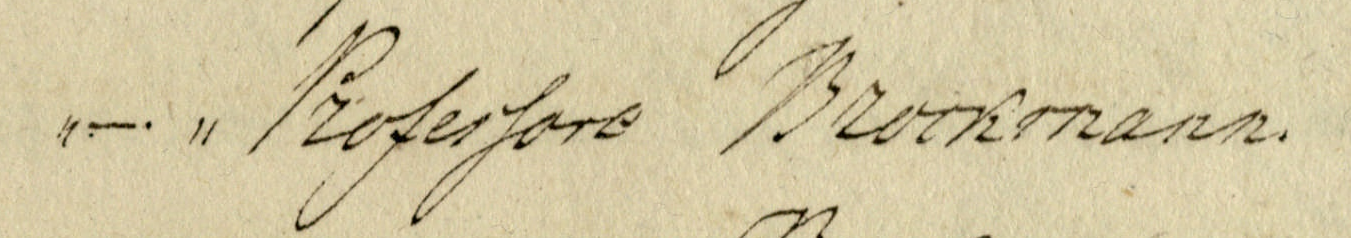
Professore Brockmann.
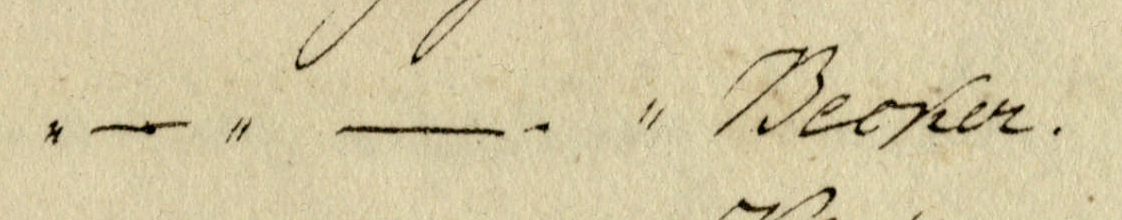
Becker.
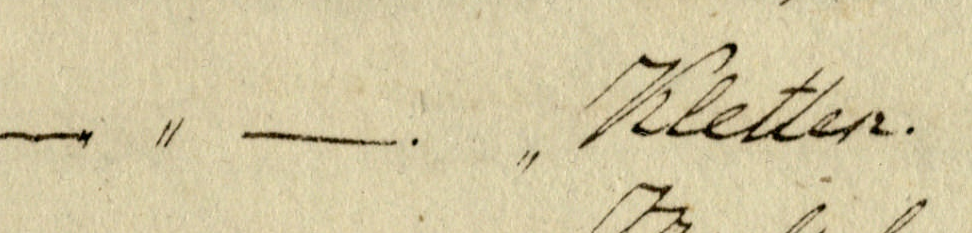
Kletten.
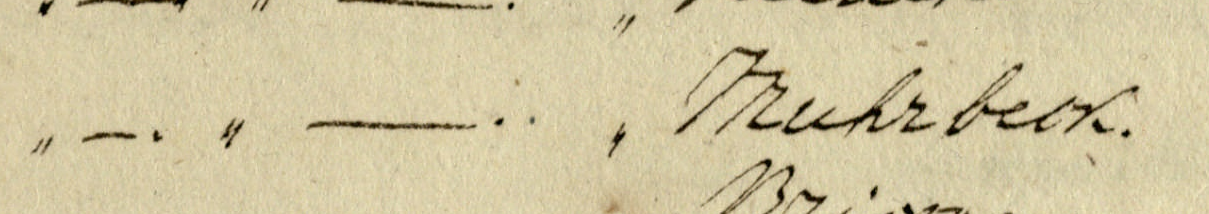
Muhrbeck.
